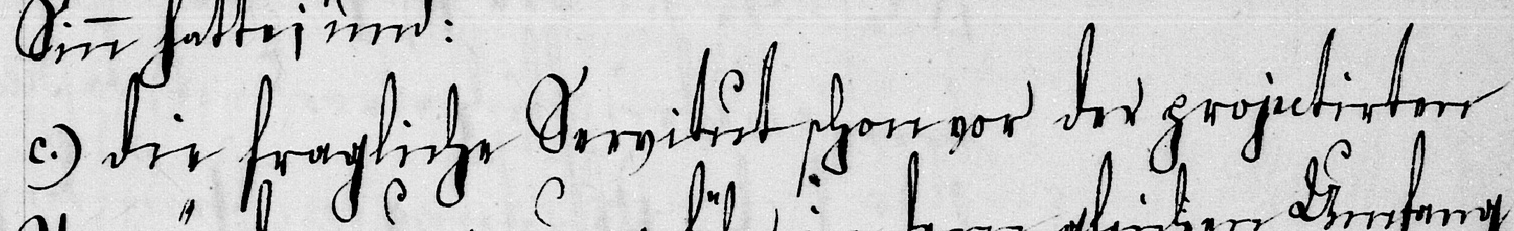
c.) die fragliche Servitut schon vor der projectirten
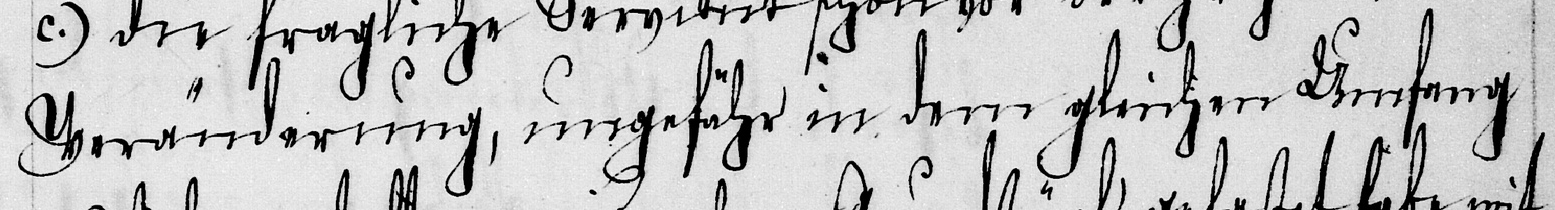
Veränderung, ungefähr in dem gleichen Umfang
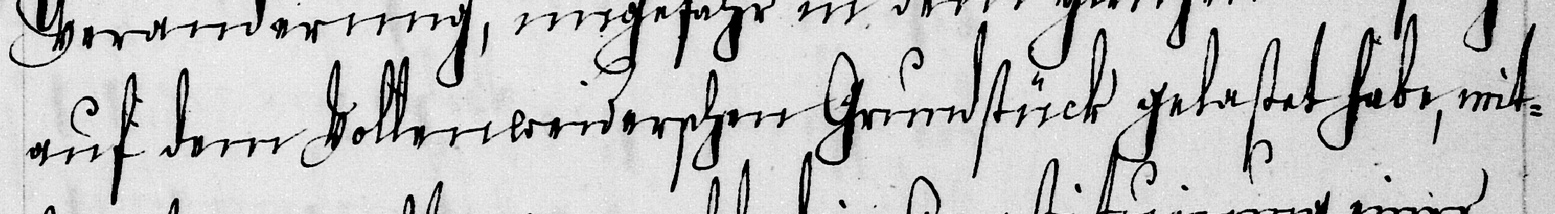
auf dem Vollenweiderschen Grundstück gelastet habe, mi¬
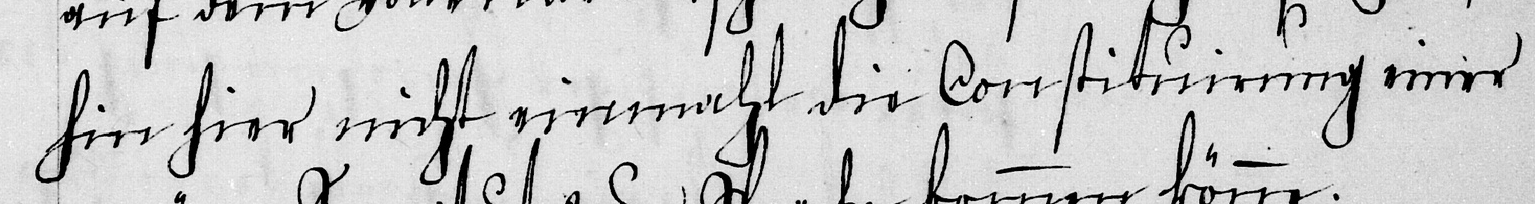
thin hier nicht einmahl die Constituierung einer
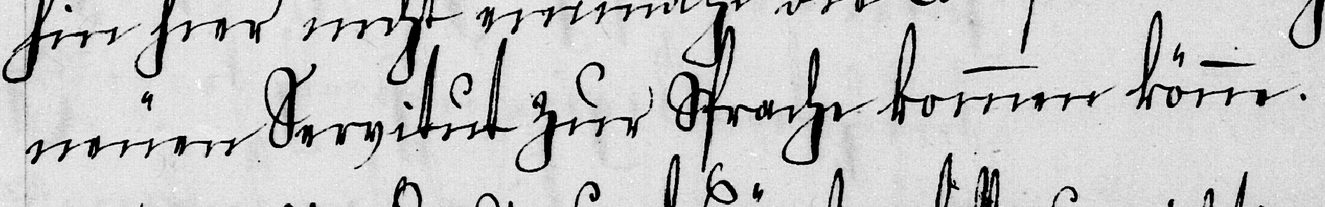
neuen Servitut zur Sprache kommen könne.
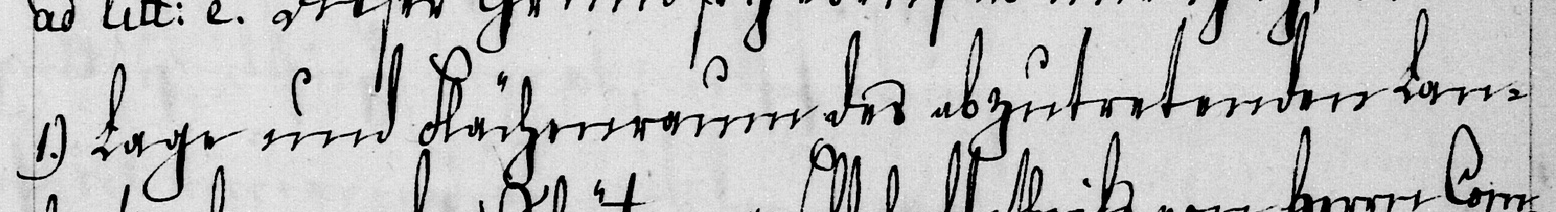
1.) Lage und Flächenraum des abzutretenden Lan¬
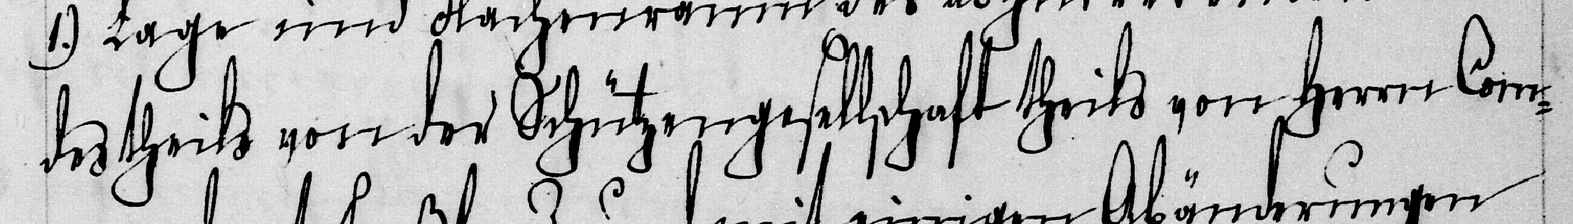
destheils von der Schützengesellschaft theils von Herrn Com¬
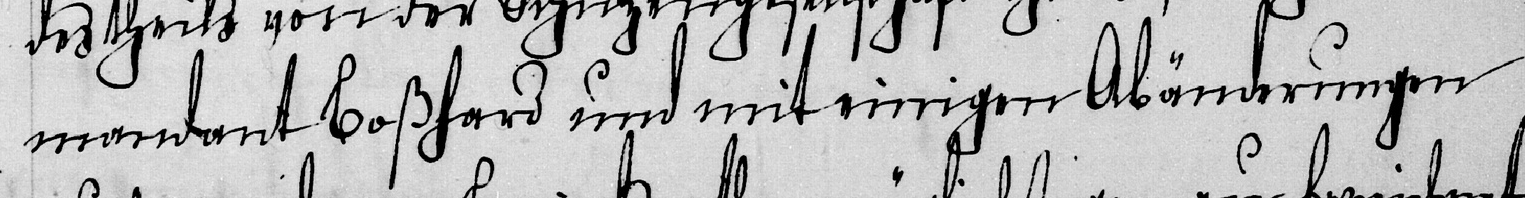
mandant Boßhard und mit einigen Abänderungen
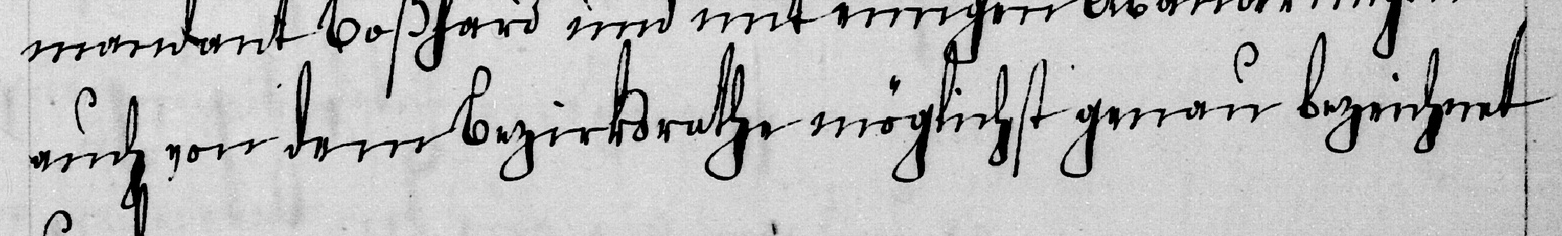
auch von dem Bezirksrathe möglichst genau bezeichnet
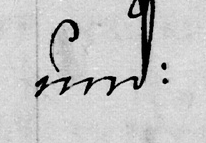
und:
